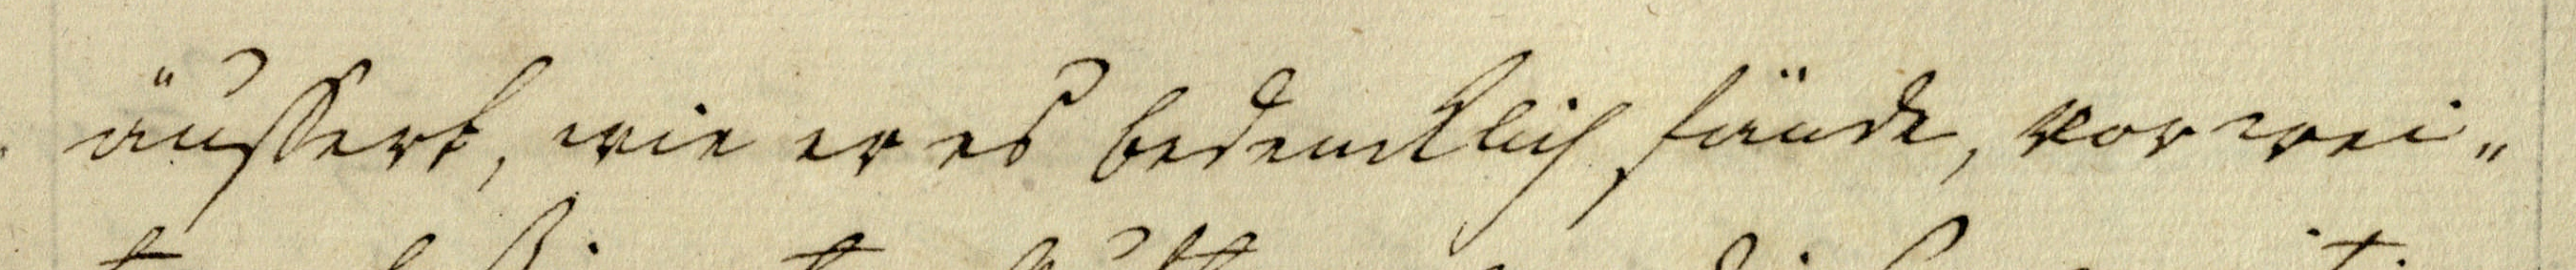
äussert, wie er es bedencklich fände, vor wei¬
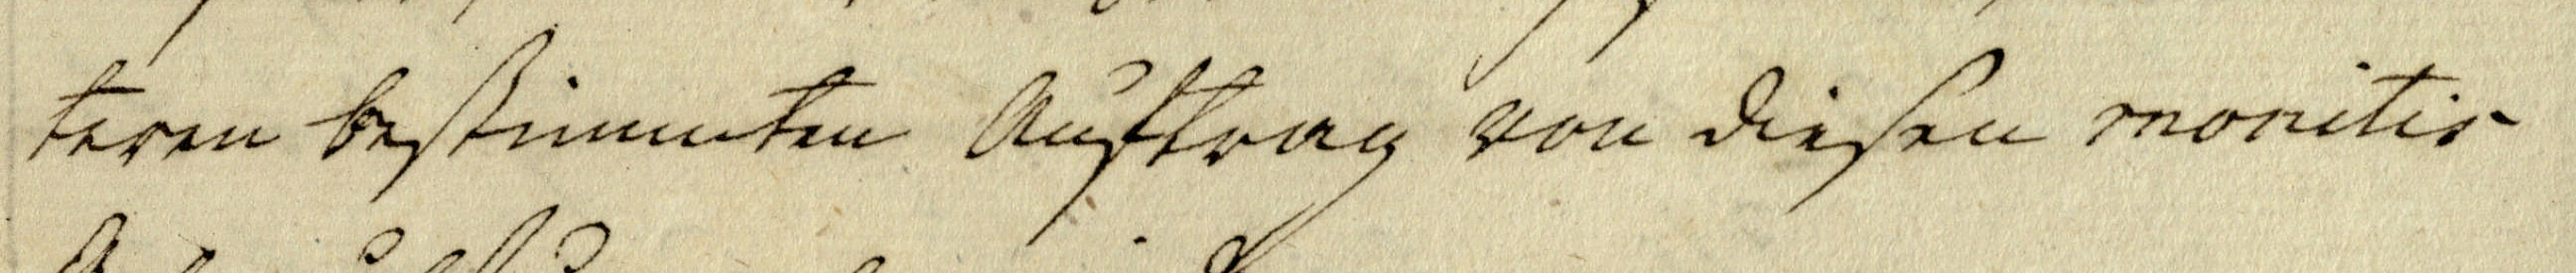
teren bestimmten Auftrag von diesen monitis
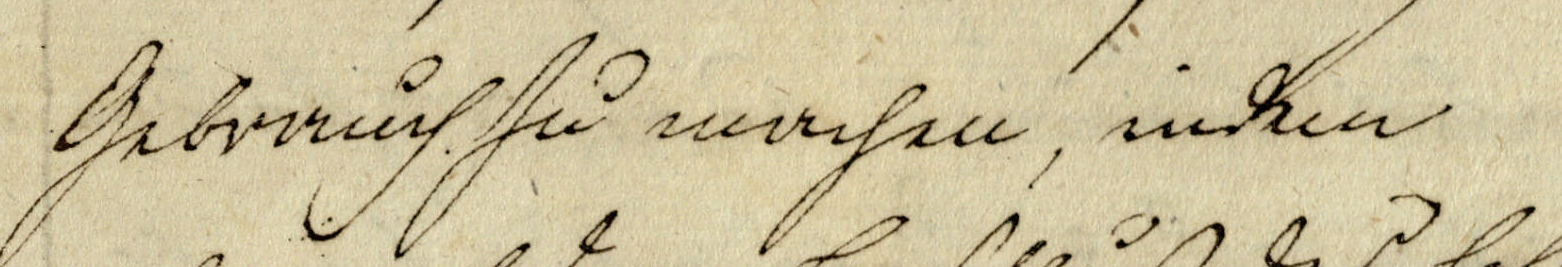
Gebrauch zu machen, indem
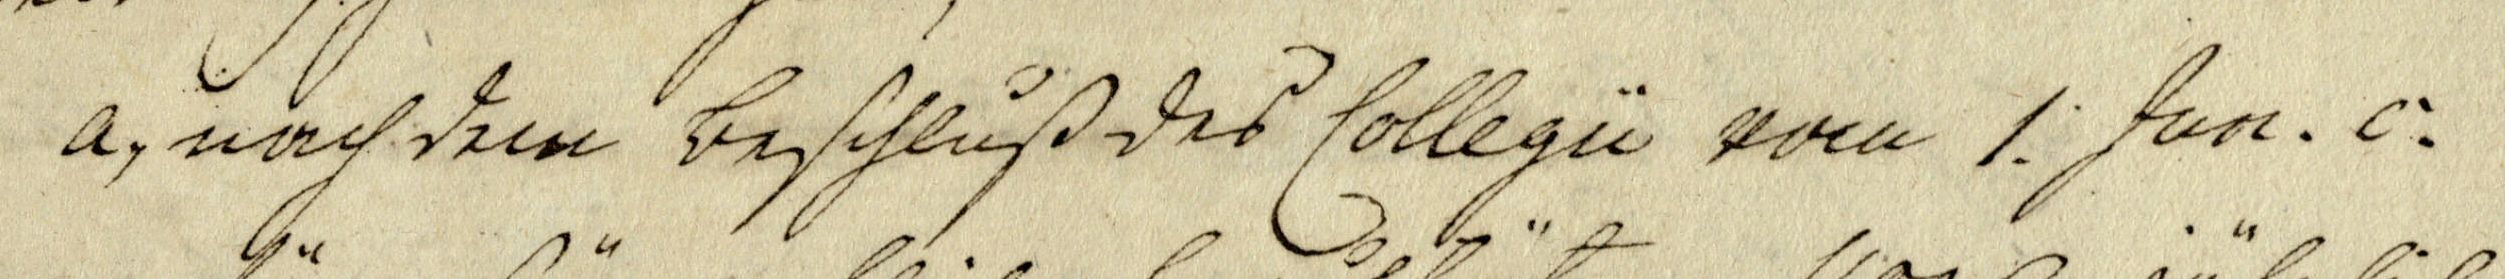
a, nach dem Beschluß des Collegii vom 1. Jun. c.
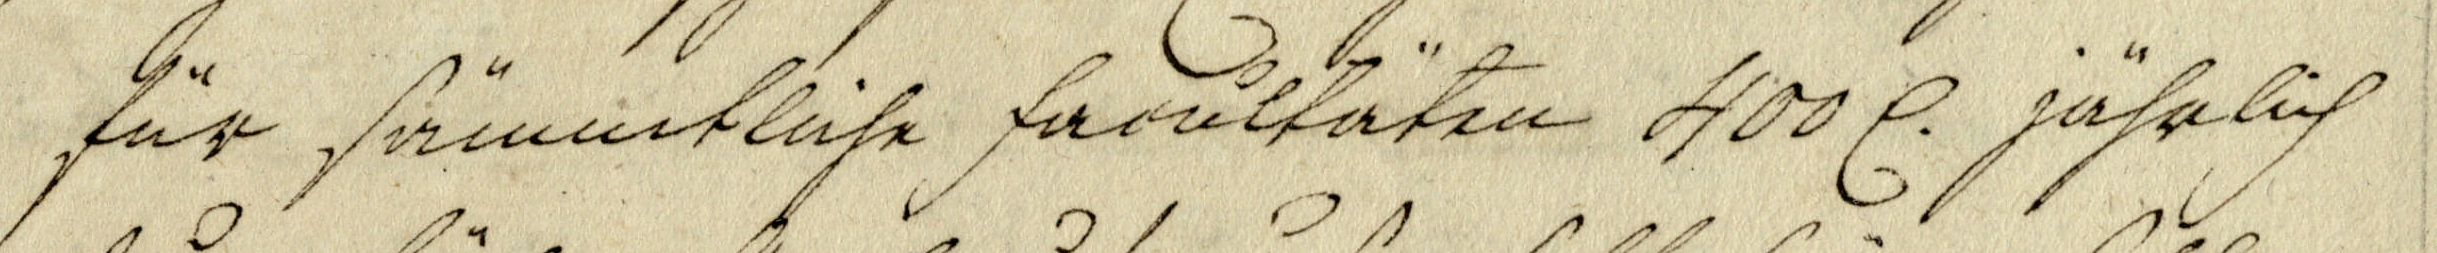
für sämmtliche Facultäten 400 l. jährlich
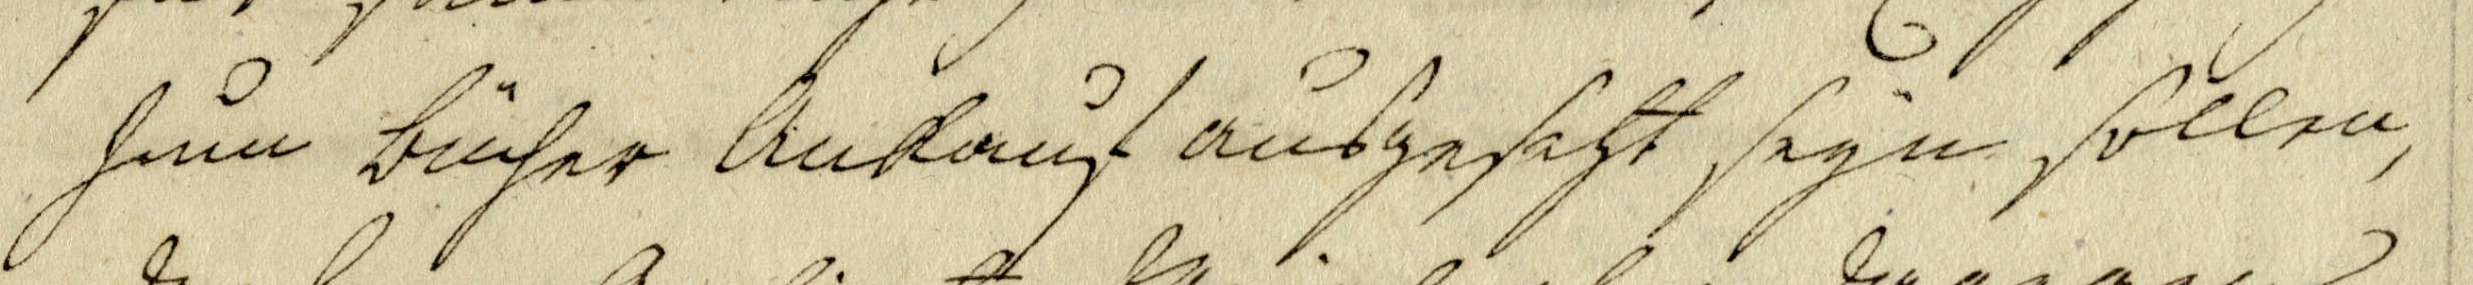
zum Bücher Ankauf ausgesetzt seÿn sollen,
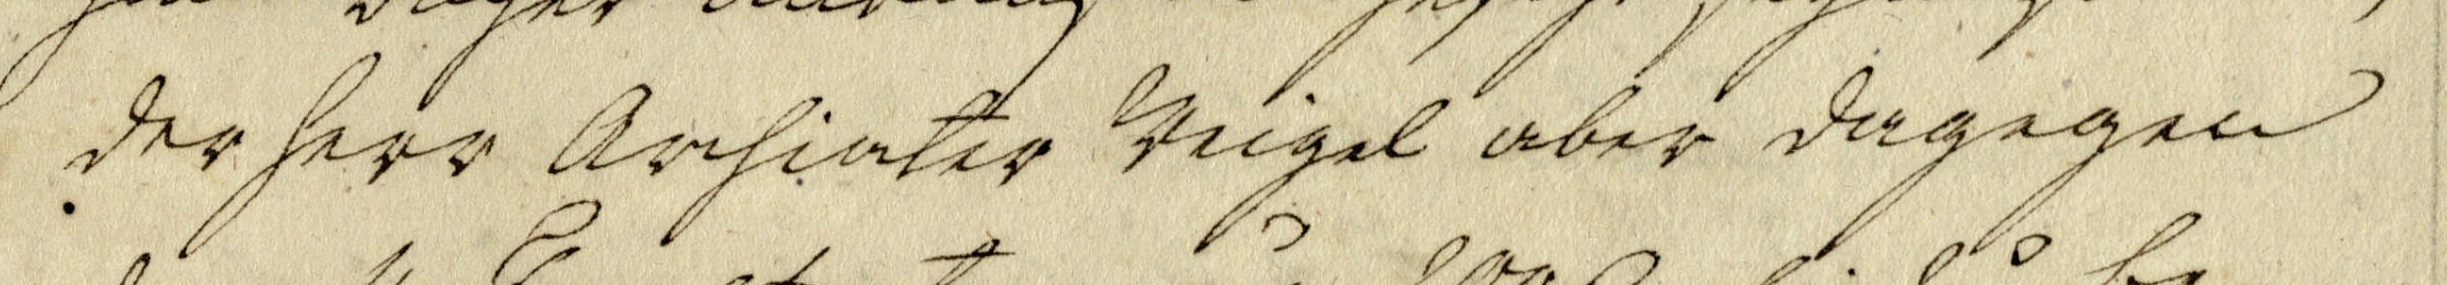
der Herr Archiater Weigel aber dagegen
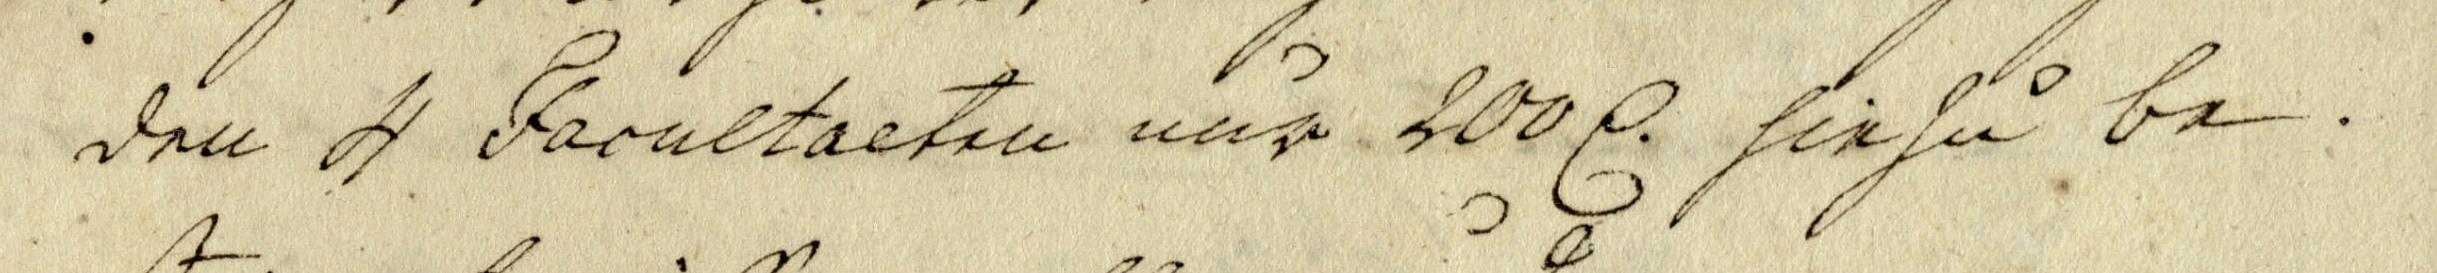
den 4. Facultaeten nur 200 l. hiezu be¬
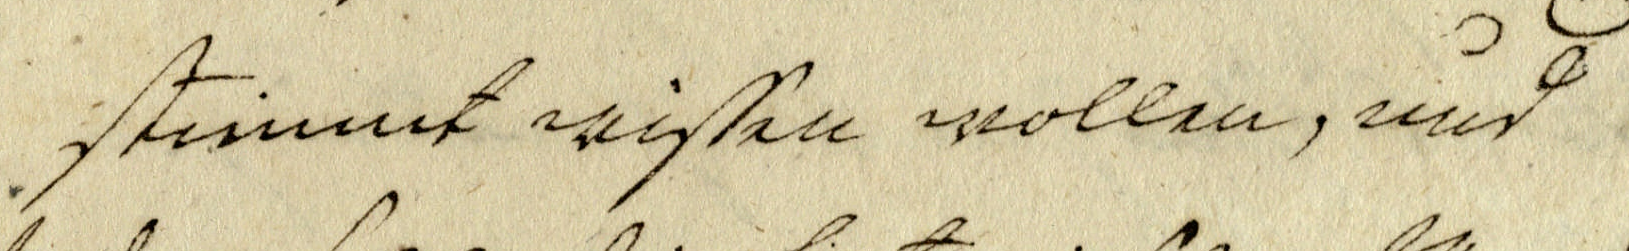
stimmt wissen wollen, und
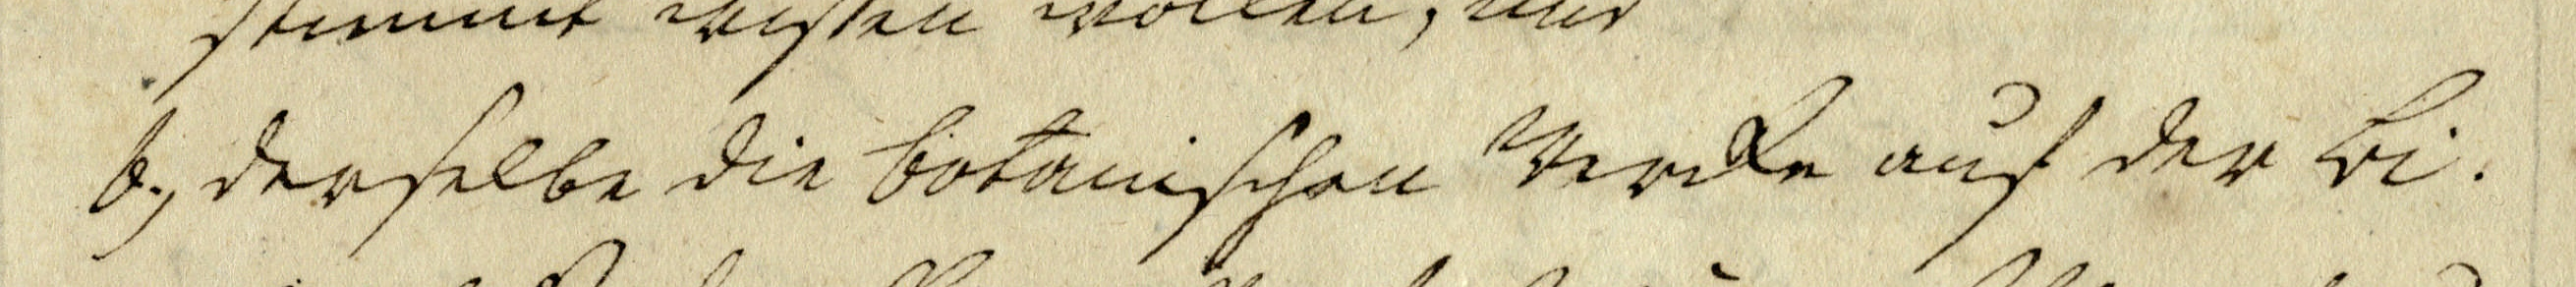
b, derselbe die botanischen Wercke auf der Bi¬
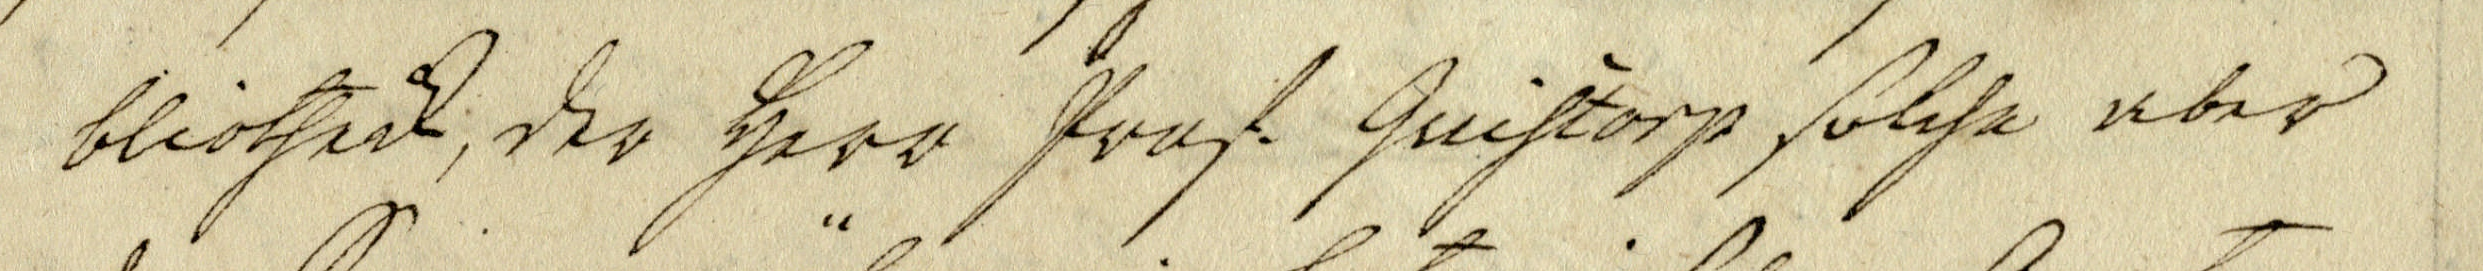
bliotheck, der Herr Prof. Quistorp solche aber
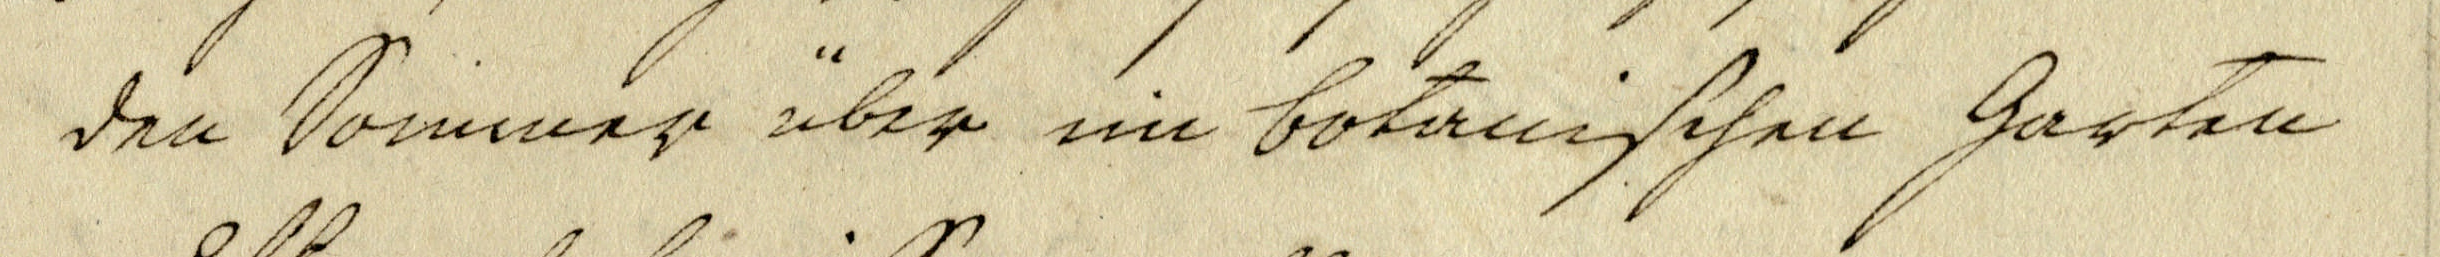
den Sommer über im botanischen Garten
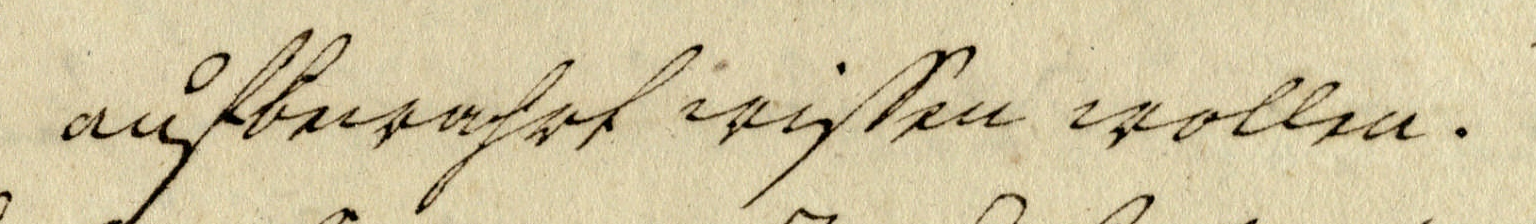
aufbewahrt wissen wollen.
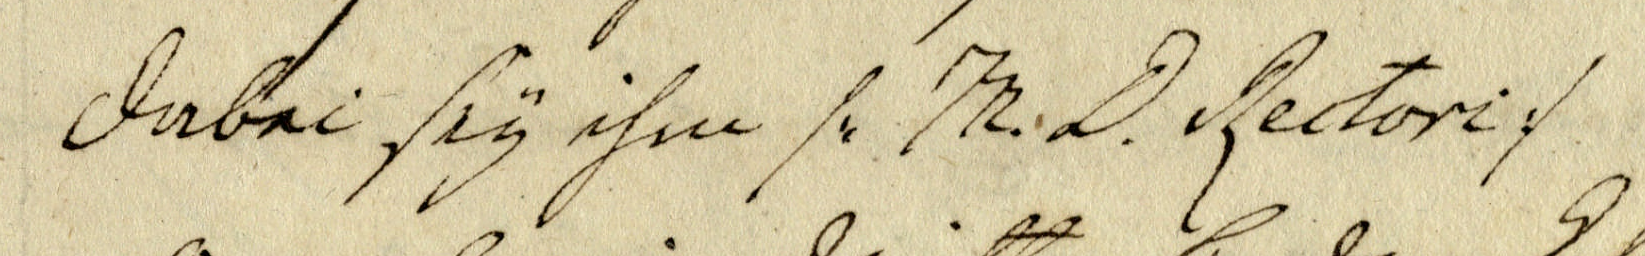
Dabei seÿ ihm /: M. D. Rectori :/
